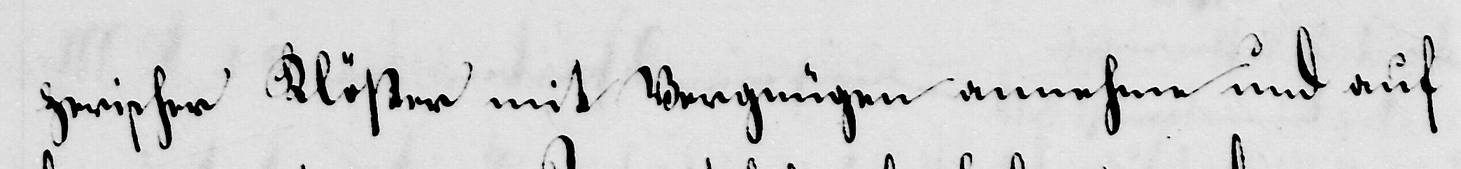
zerischer Klöster mit Vergnügen annehme und auf
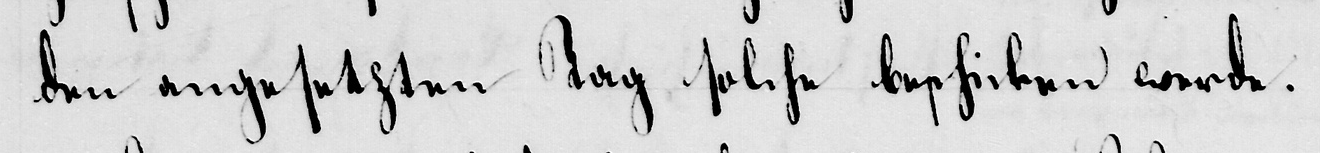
den angesetzten Tag solche beschicken werde.
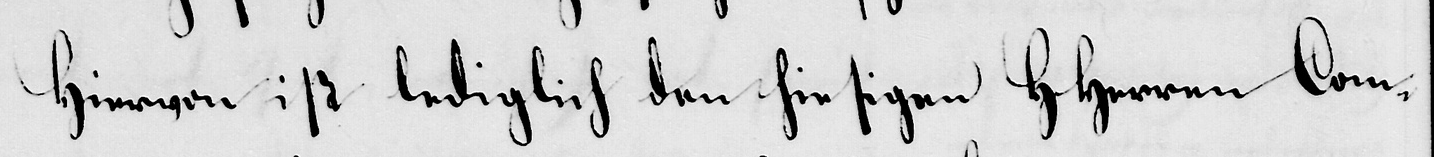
Hiervon ist lediglich den hiesigen HHerren Com¬
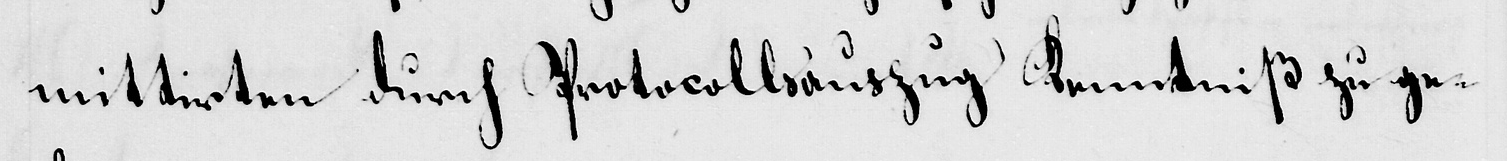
mittirten durch Protocollsauszug Kenntniß zu ge¬
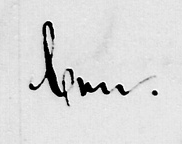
ben.
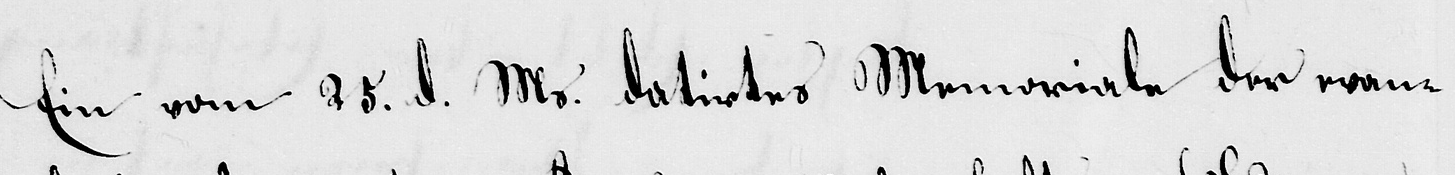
Ein vom 25. d. Ms. datirtes Memoriale der evan¬
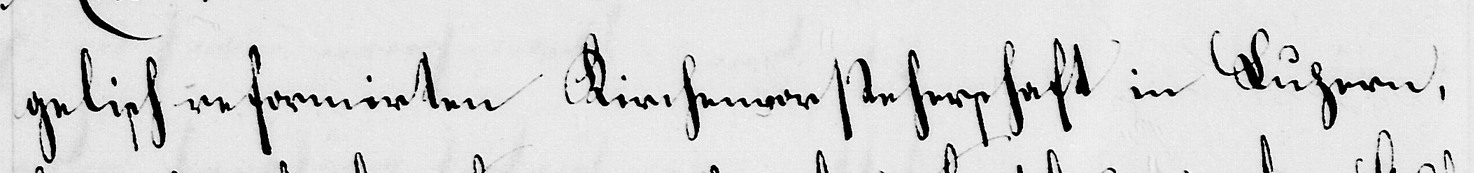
gelisch reformirten Kirchenvorsteherschaft in Luzern,
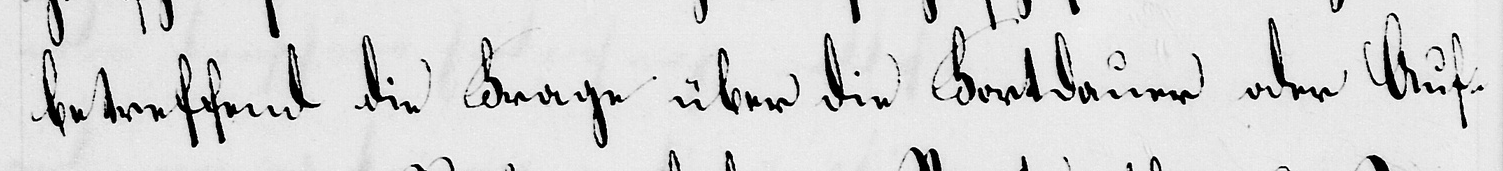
betreffend die Frage über die Fortdauer oder Auf¬
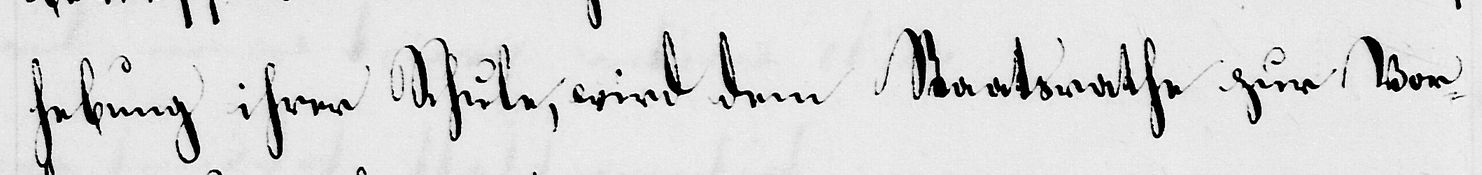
hebung ihrer Schule, wird dem Staatsrathe zur Vor¬
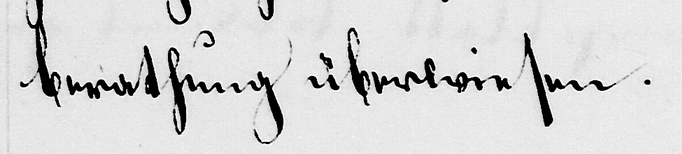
berathung überwiesen.
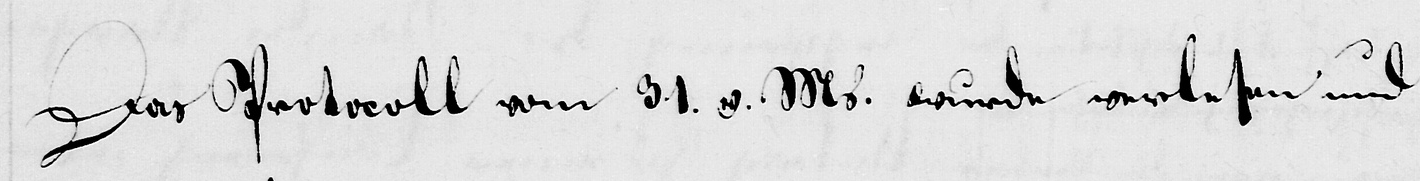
Das Protocoll vom 31. v. Ms. wurde verlesen und
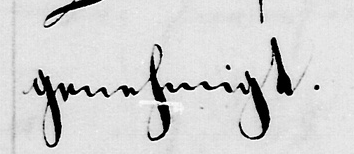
genehmigt.
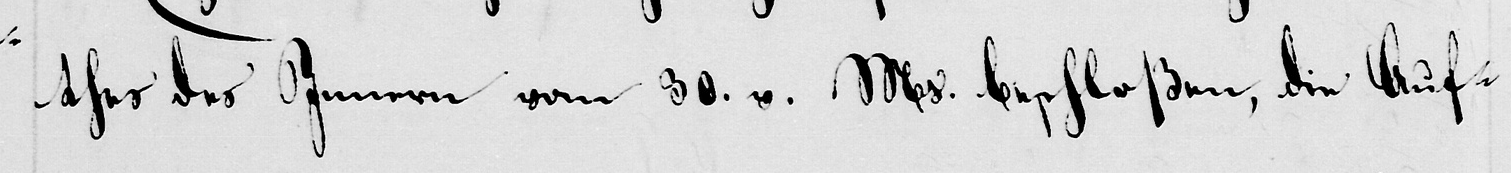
thes des Innern vom 30. v. Ms. beschloßen, die Auf-
